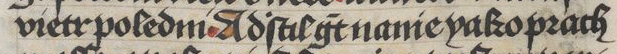vietr poledni.Adẛtil ḡt nanie yako prach
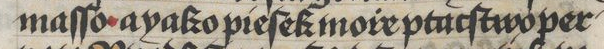maſſo.a yako píeſek moṙe ptacſtwo per¬
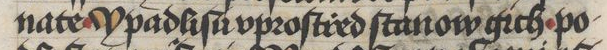nate.Ypadliſu vproſtṙed ſtanow gich.po¬
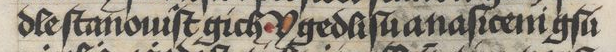dle ſtanouiẛt gich.Ygedliſu a naſiceni gſú
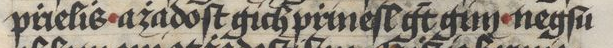pṙieliṡ.na żadoſt gich pṙineſl ḡt gim.negſu
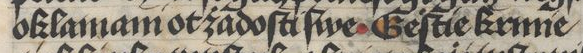oklamani ot żadoſti ſwe.Geẛtie krmie
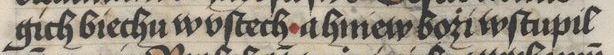gích biechu w vſtech.a hniew bożí wſtupil
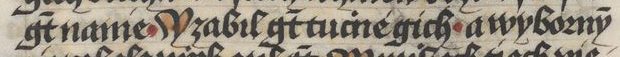ḡt nanie. Y zabil ḡt tuċné gich.a wybornӯ
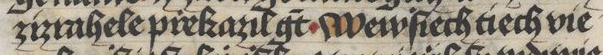z izrahele pṙekazil ḡt.Wewẛiech tiech vie¬
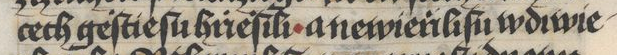cech geẛtieſu hṙieẛili.a newieṙili ſu wdiwie¬
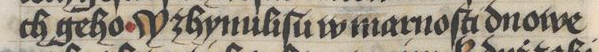ch geho.Yzhynuliſu w marnoſti dnowe
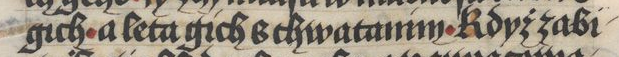gich.a leta gich s chwataním.Kdyż zabi¬
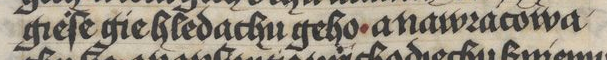gieẛe gie hledachu geho.a nawracowa¬
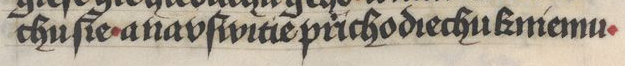chu ſie.a navſwitie pṙíchodiechu kníemu.
